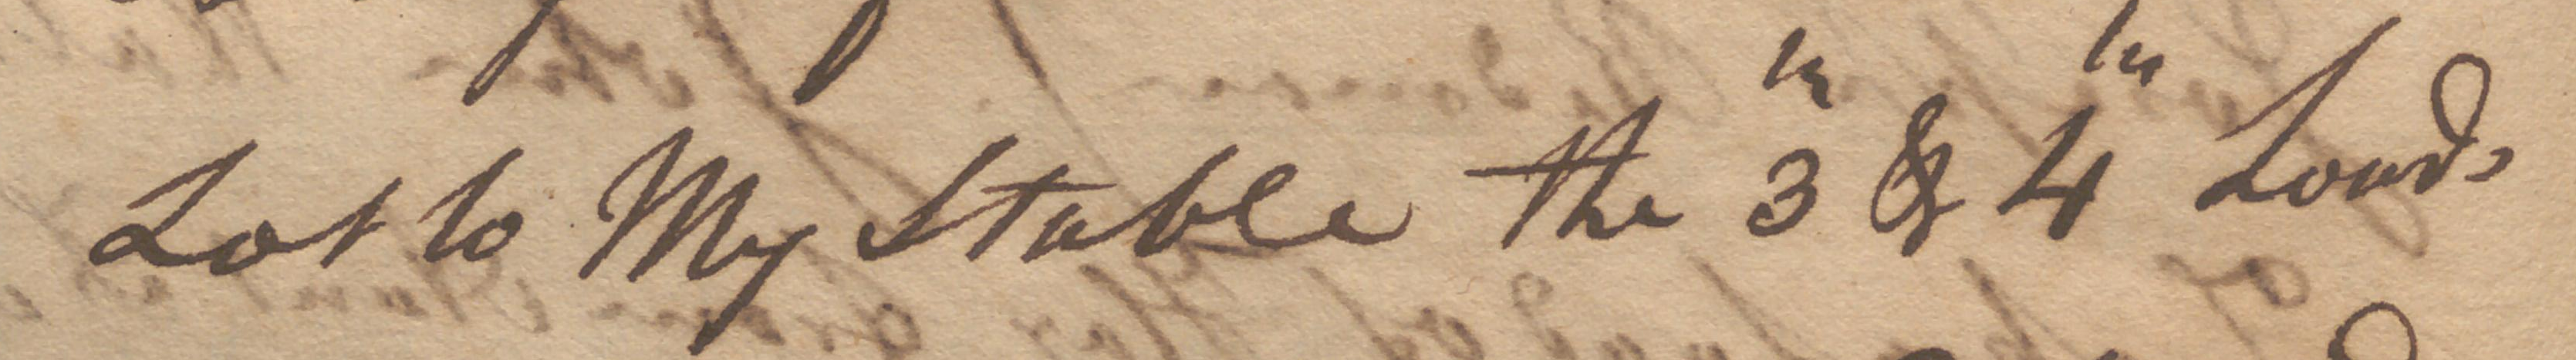Lot to My Stable the 3^th & 4^th Loads
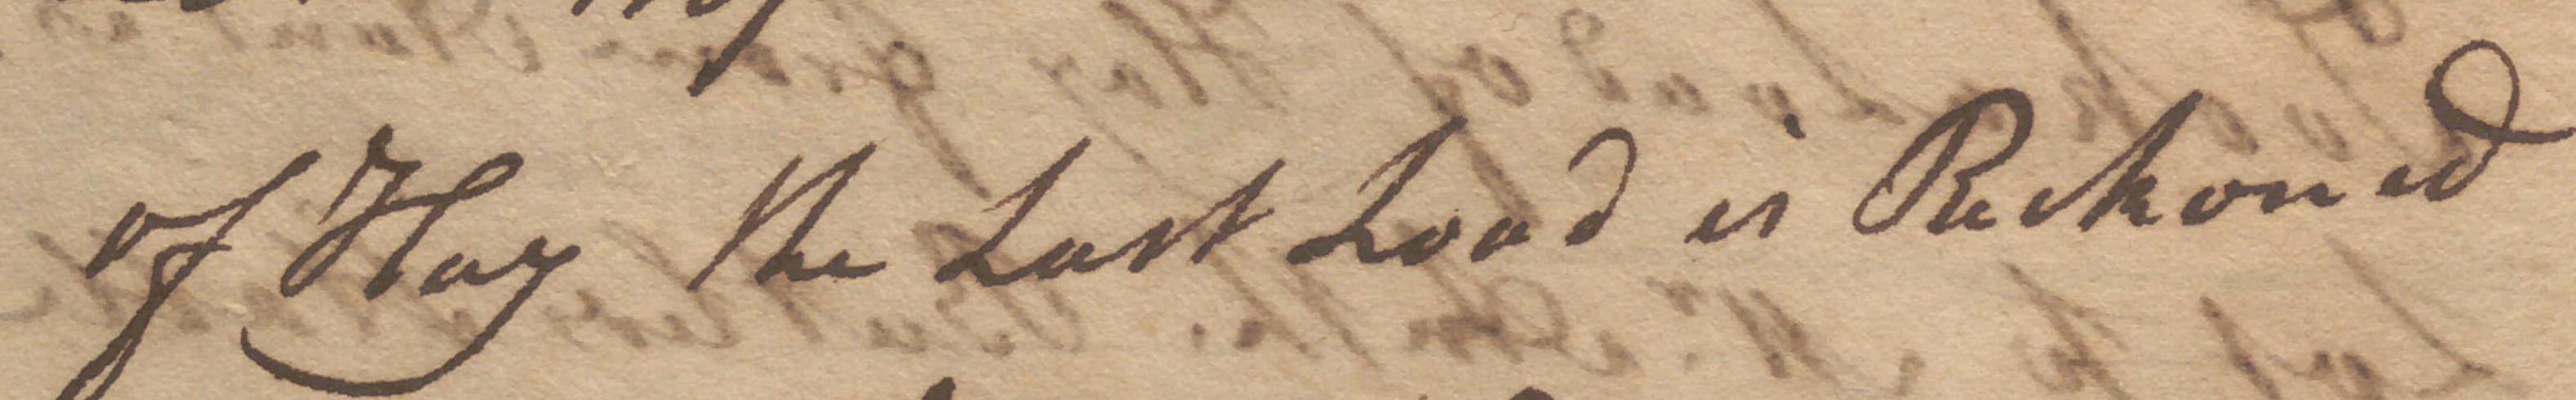of Hay the Last Load is Reckoned
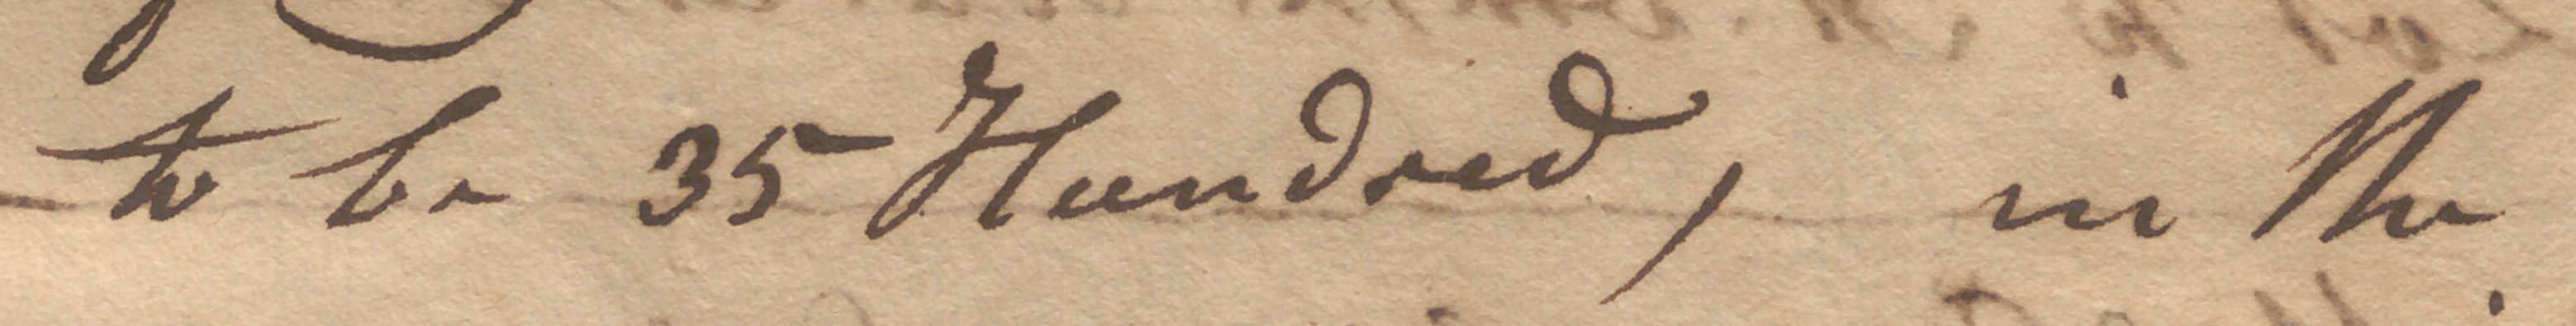to be 35 Hundred, in the
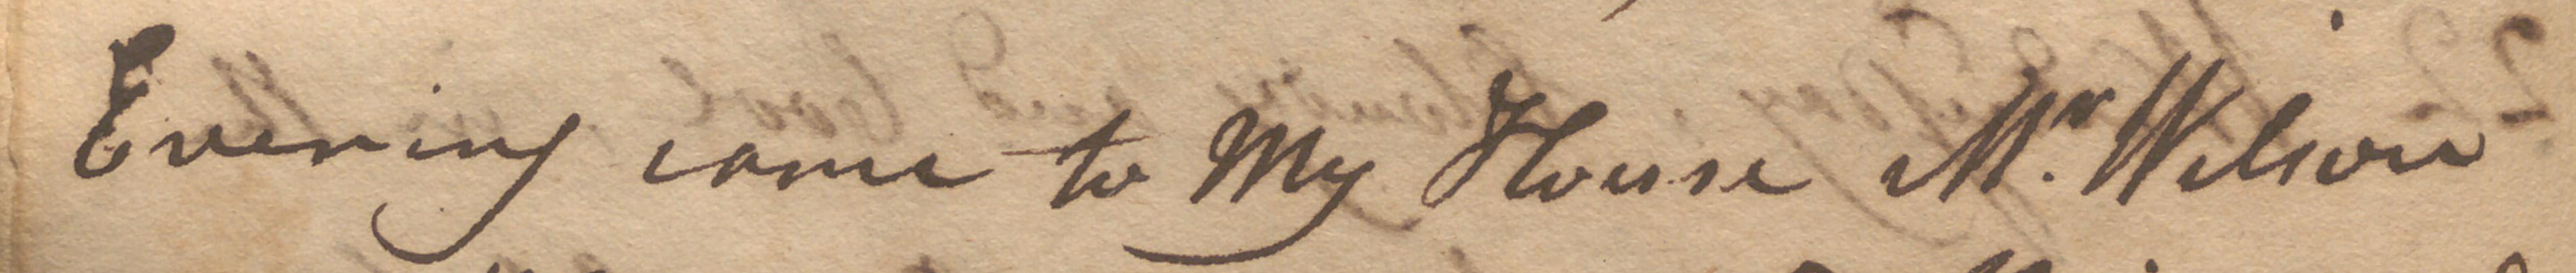Evening come to My House M^r. Wilson
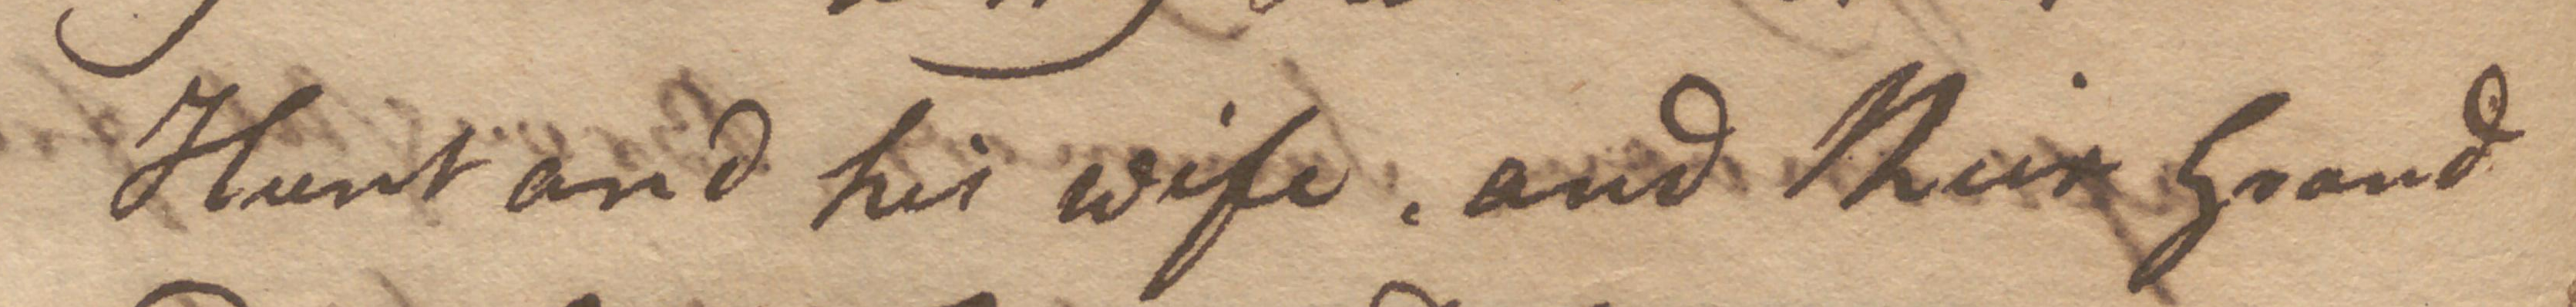Hunt and his wife, and their Grand
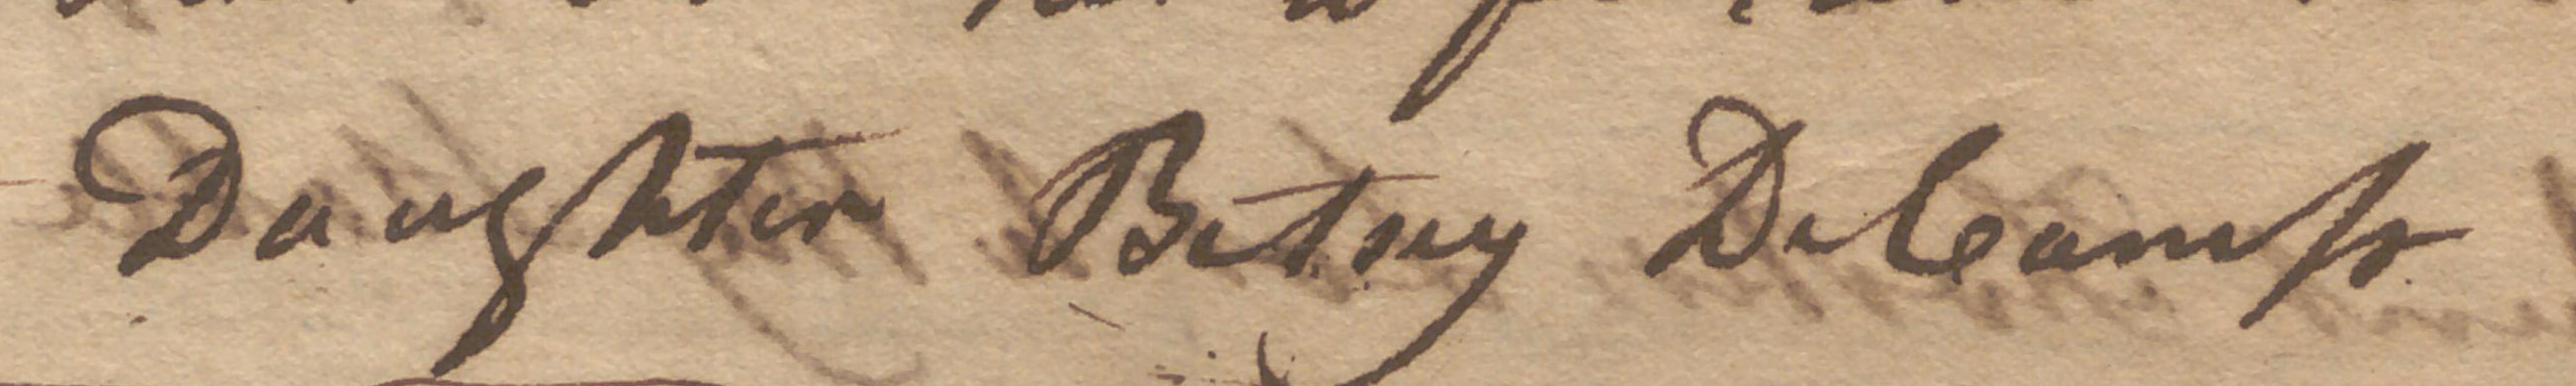Daughter Betsy DeCamp
